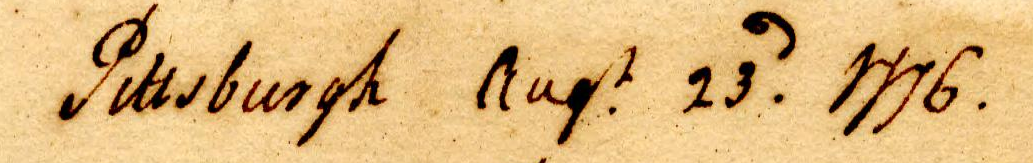Pittsburgh Aug^t. 23^d. 1776.
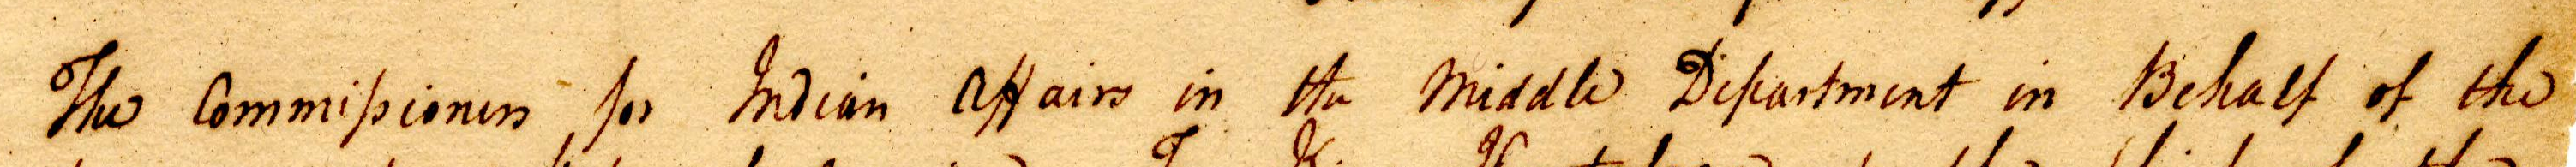The Commissioners for Indian Affairs in the Middle Department in Behalf of the
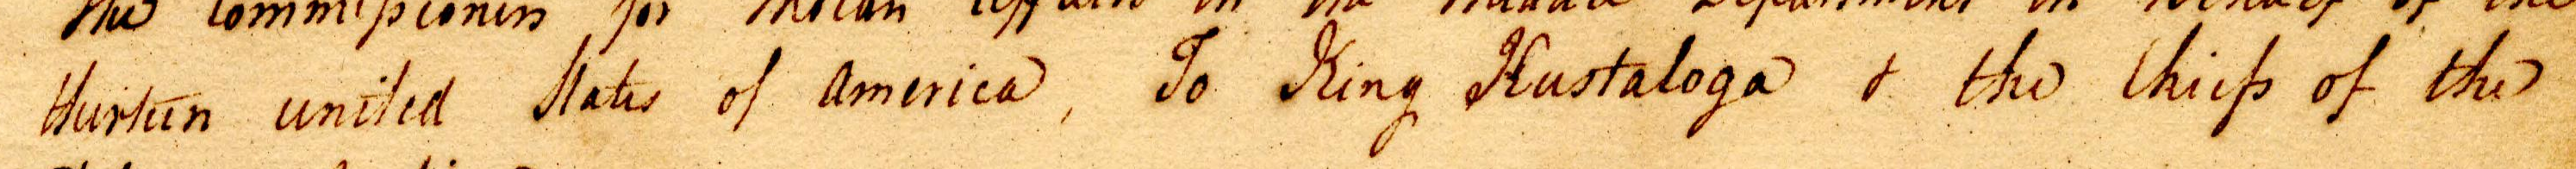thirteen united States of America, To King Kustaloga & the Chiefs of the
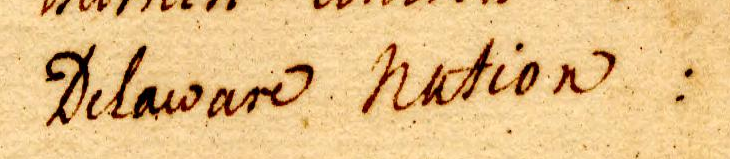Delaware Nation:
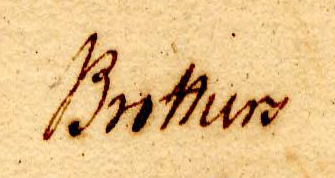Brothers
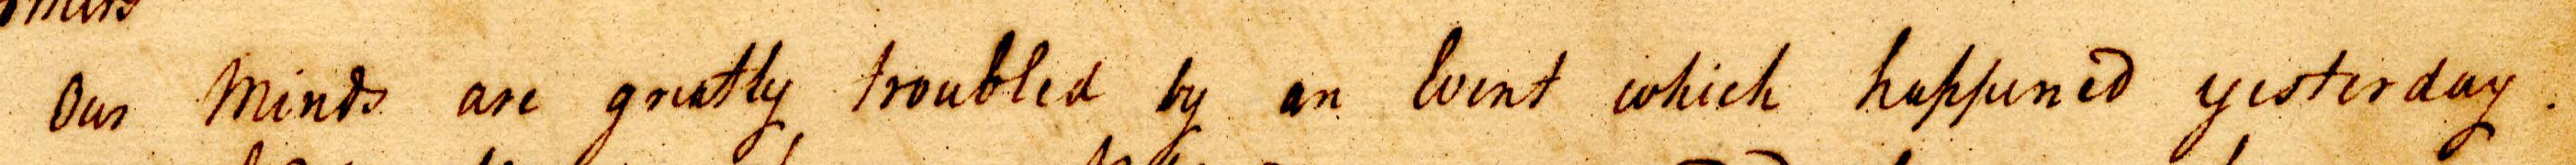Our Minds are greatly troubled by an Event which happened yesterday.
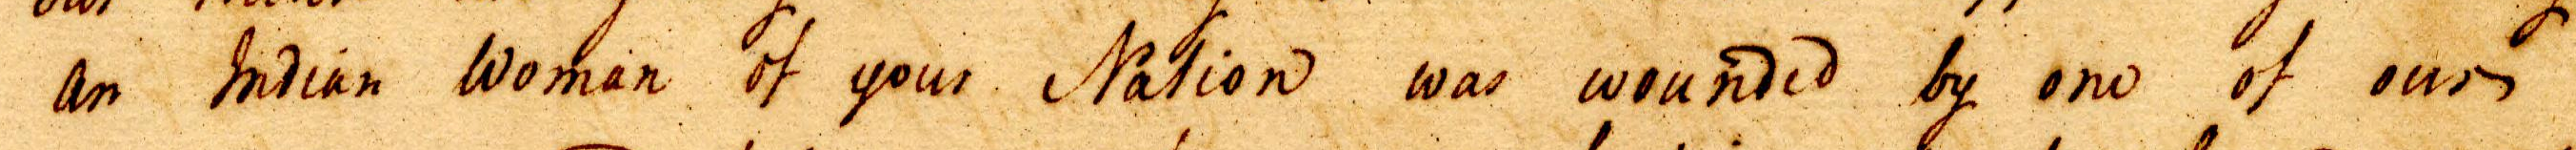An Indian Woman of your Nation was wounded by one of our
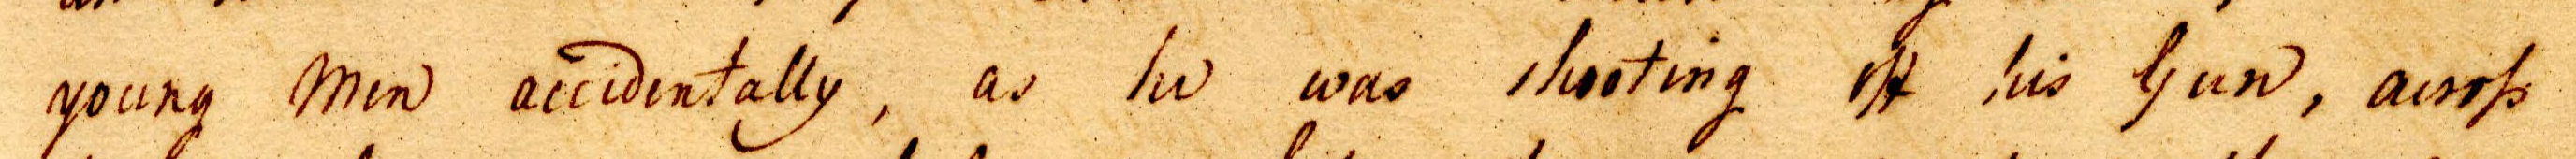young men accidentally, as he was shooting off his Gun, across
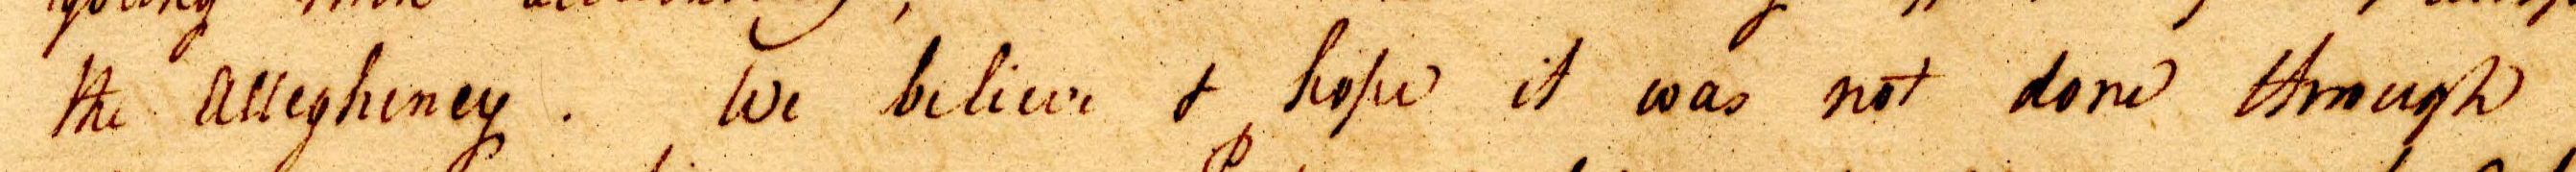the Allegheny. We believe & hope it was not done through
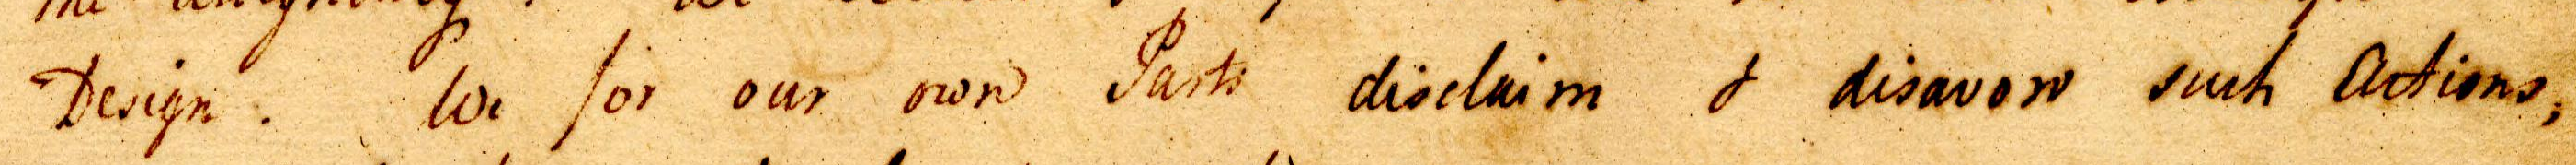Design. We for our own Parts disclaim & disavow such Actions,
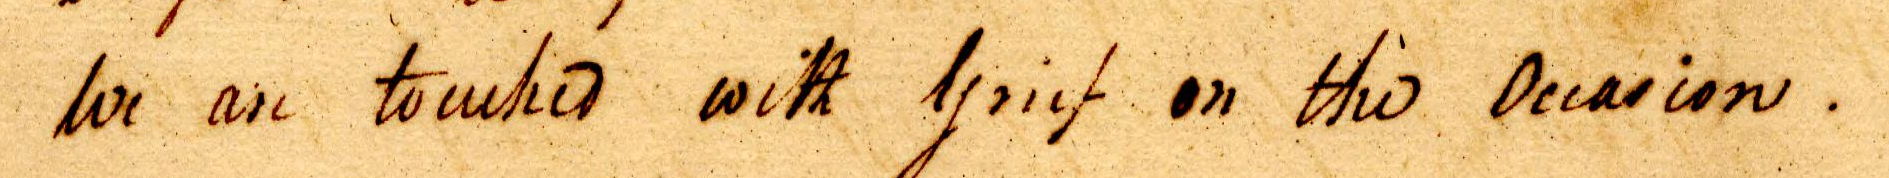we are touched with Grief on the Occasion.
